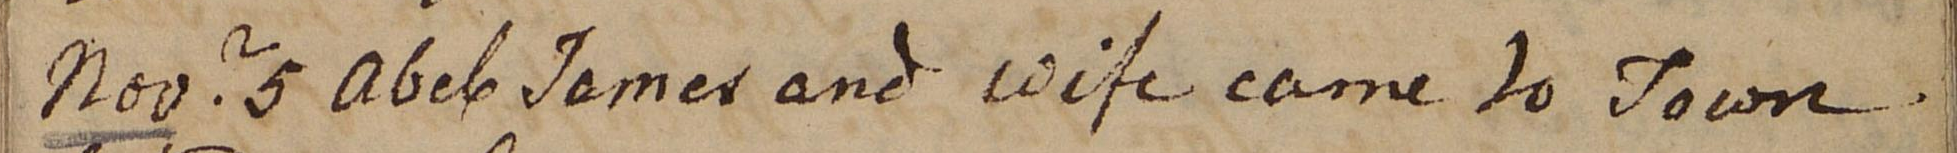Nov.^r 5 Abel James and wife came to Town
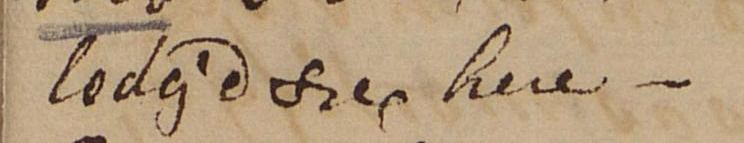lodg'd &c here-
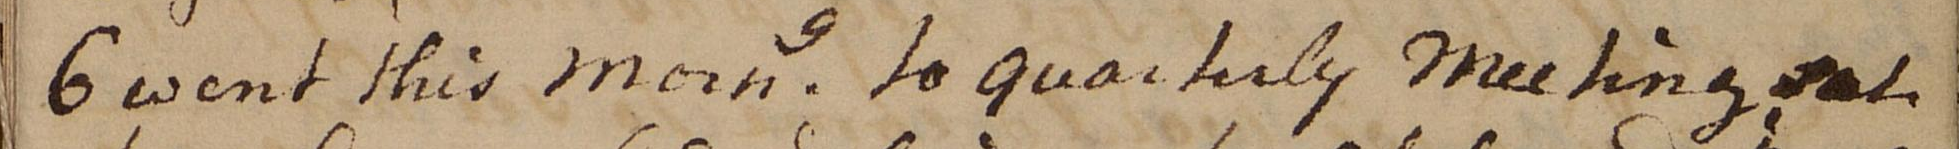6 went this morn^g. to quarterly meeting at
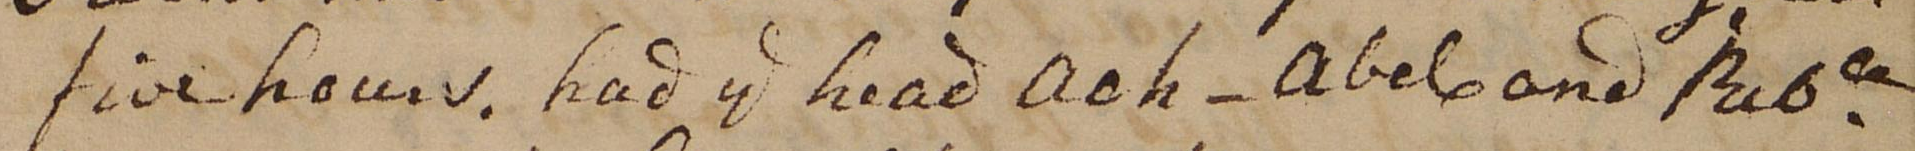five hours, had y^e head Ach- Abel and Reb^a
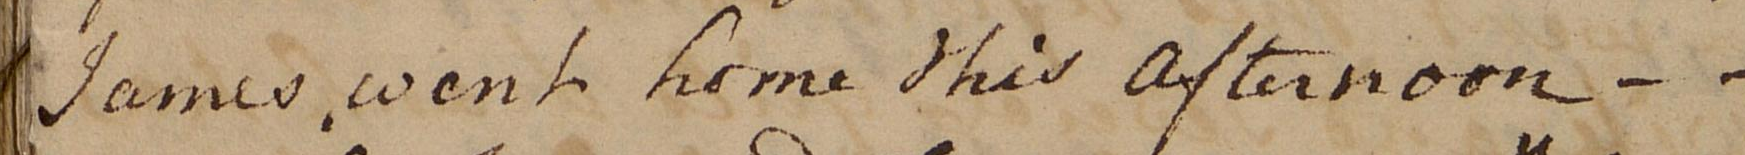James, went home this Afternoon-
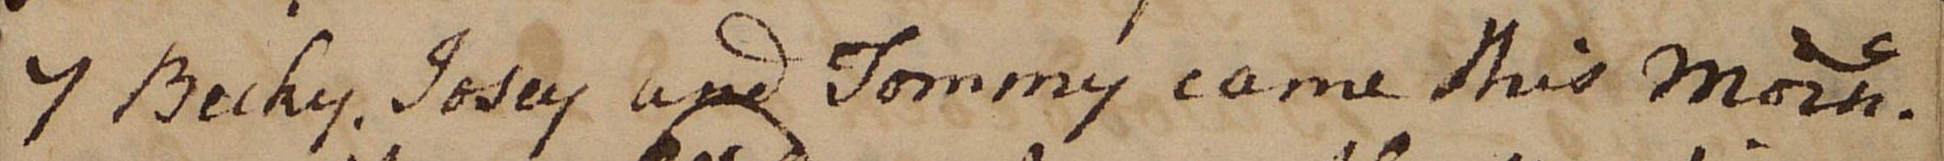7 Becky, Josey and Tommy came this morn^g.
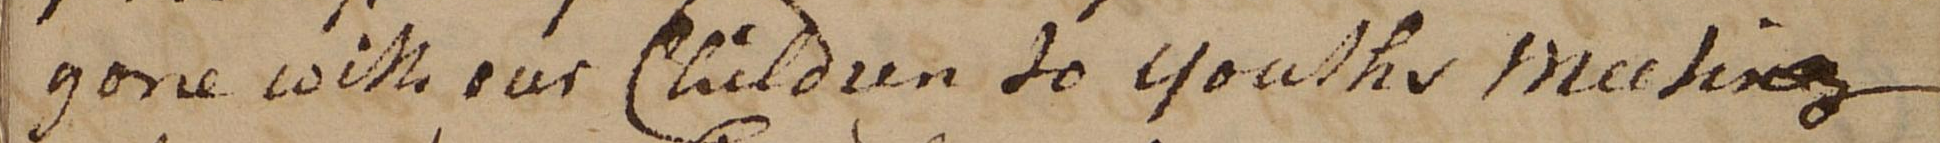gone with our Children to Youths Meeting
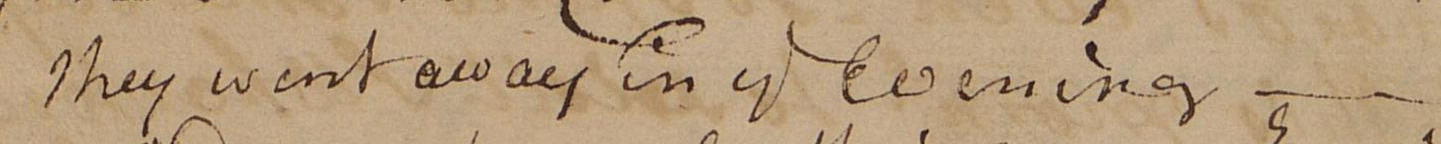they went away in y^e Evening-
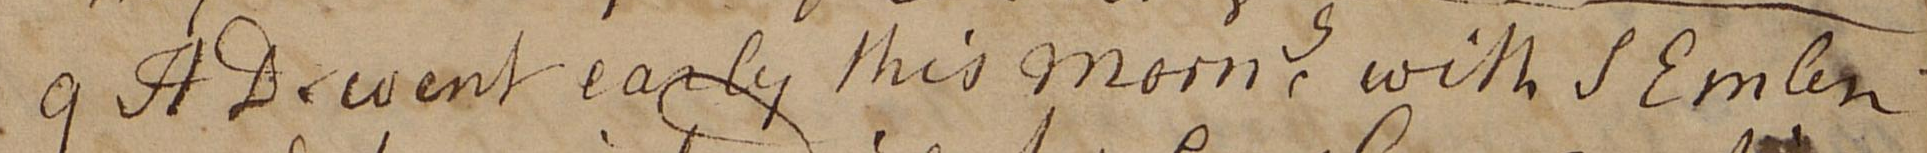9 HD went early this morn^g. with S Emlen
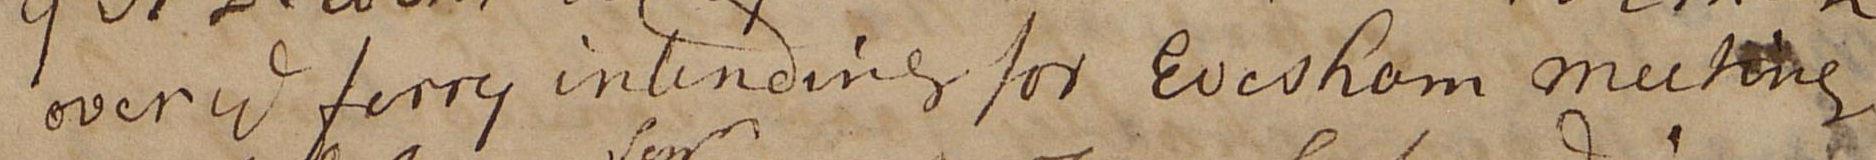over y^e ferry intending for Evesham meeting
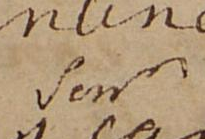Sen^r
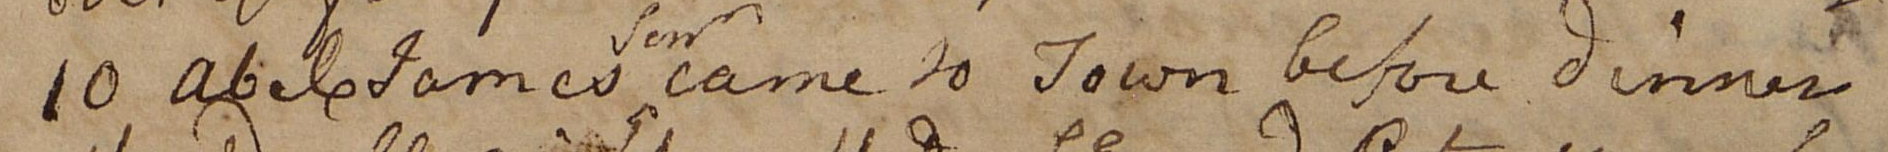10 Abel James ^ came to Town before dinner
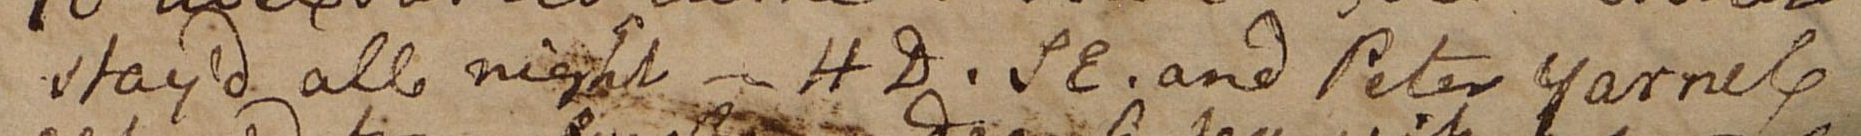stay'd all night- HD. SE. and Peter Yarnel
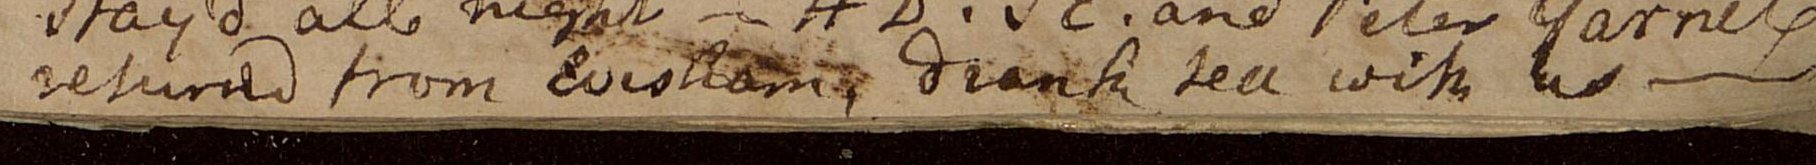returnd from Evesham, drank tea with us-
